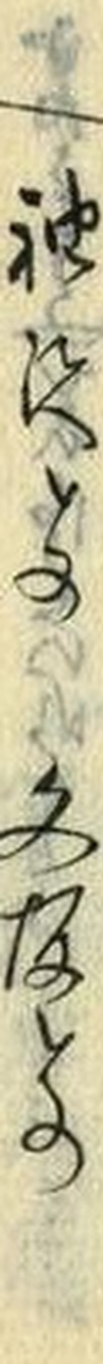袖沢との文坂との
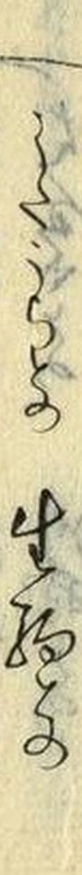したうらとの生駒との
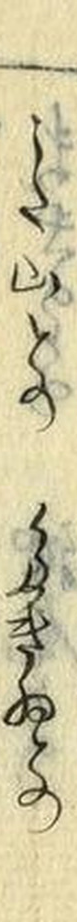した山とのたきゐとの
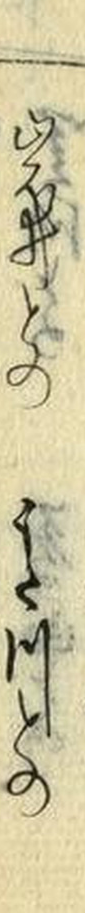岩井とのうた川との
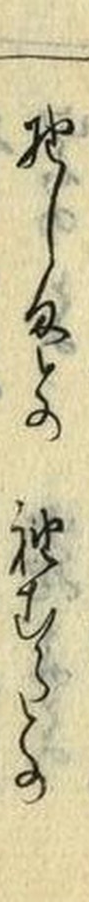野しまとの袖むらとの
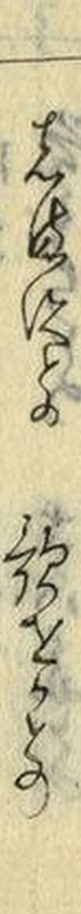しま沢との歌をかとの
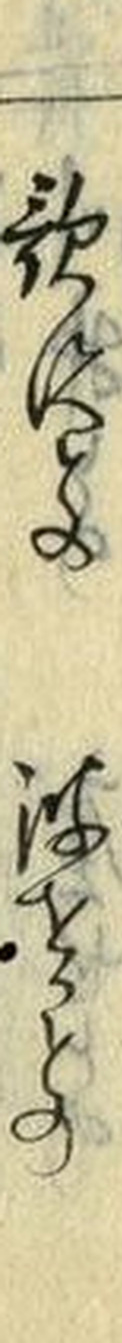歌沢との波をかとの

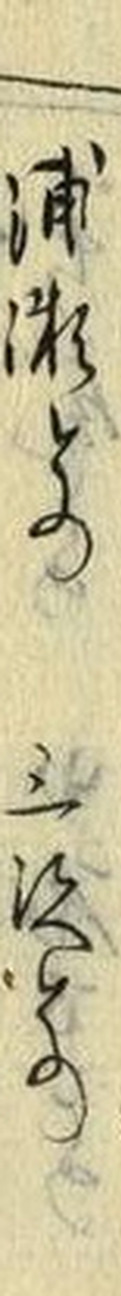浦瀬との三沢との
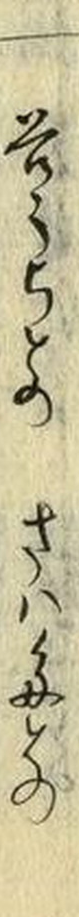谷うらとのさハたとの
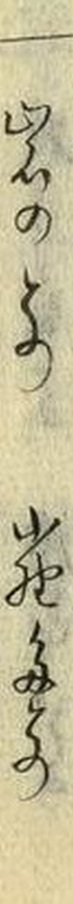岩のとの小野たとの
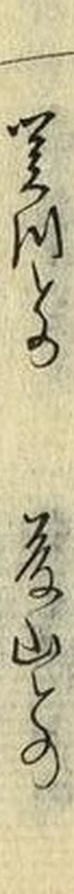関川との藤山との
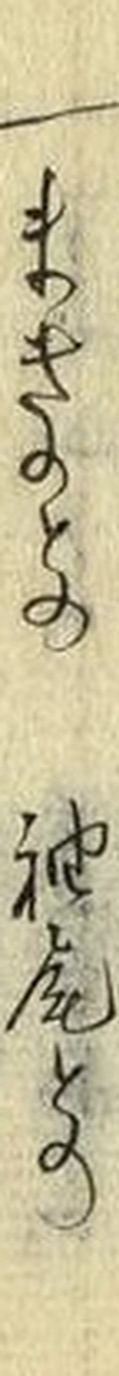まきのとの袖尾との
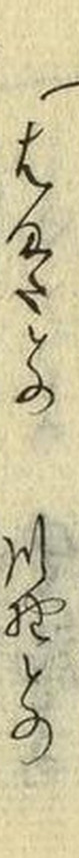はまたとの川野との
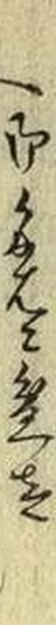御たはこ盆壱
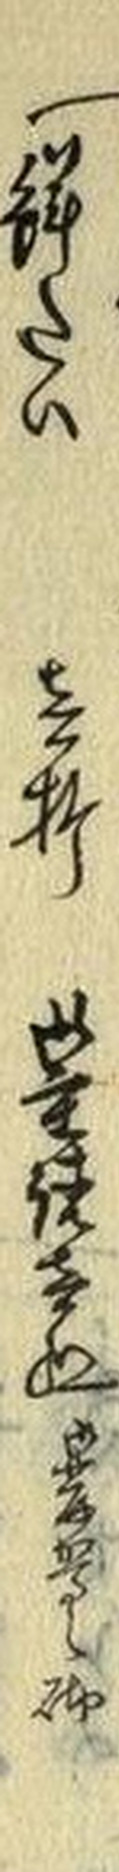鮮たい壱折御重詰壱組御発駕之砌
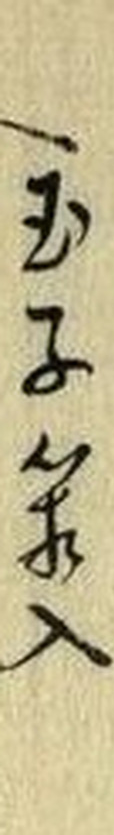玉子箱入
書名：少傅日録抄（斉善付側向頭取日記、江戸并道中、初入在国、逝去後…
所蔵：福井県文書館 Fukui Prefectural Archives
